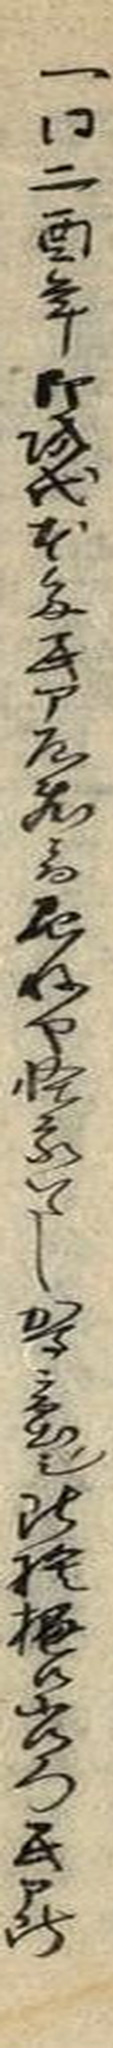一同二酉年御城代本多民部屋敷に而やねや怪我いたし駕に而出し断捨樋口小左衛門民部断
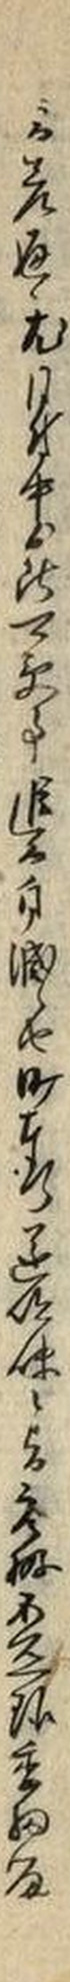に而差通甲尤目付中ゟ断可受候事追而自滅候由町奉行遂吟味候旨取扱不宜趣委細留
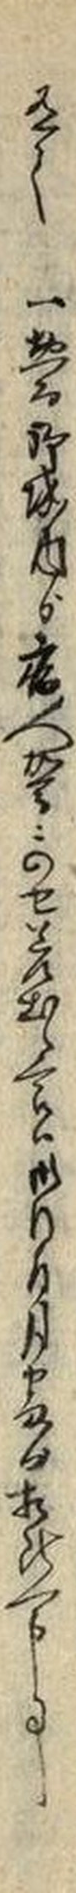有之一惣而御城内ゟ病人駕にのせ差出候節御目付月番ゟ相断可申候事
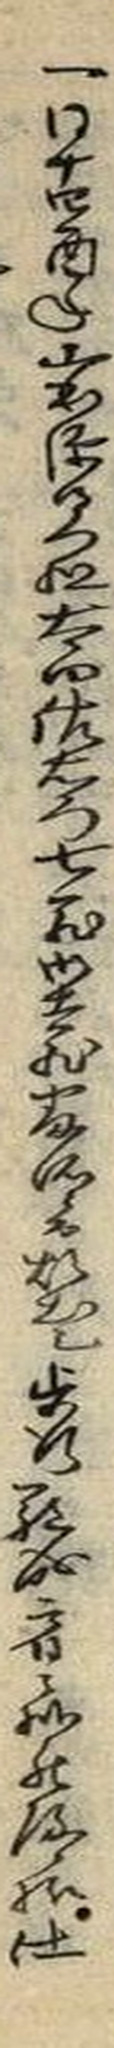一同十四酉年山本源左衛門組太田佐右衛門七蔵御土蔵番所に而煩出し歩行難成肩ニ掛罷帰候様仕
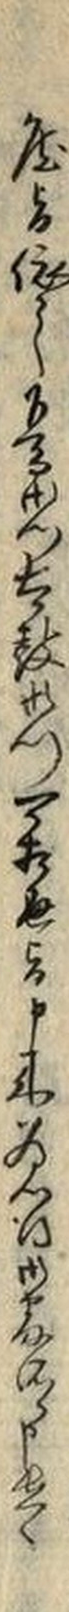度旨依之下馬御門太鼓御門可相通旨申来為心得御番所へ申遣候
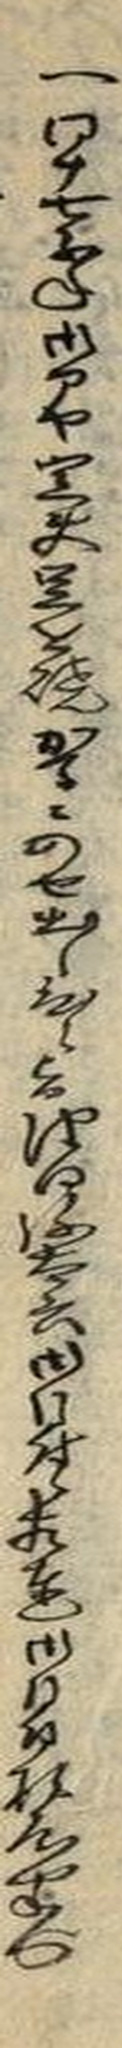一同十七子年御部屋定使足を焼駕にのせ出し度候旨津田弥太六御目付へ相達御目付栃屋半右衛門
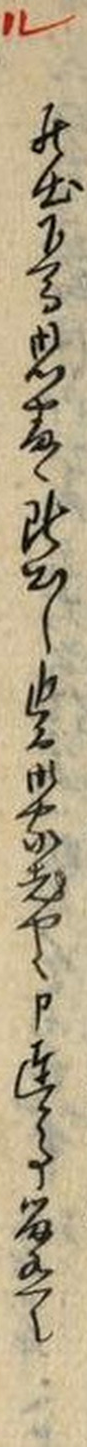罷出下馬御門番へ断出し追而御家老中へ申達候留有之

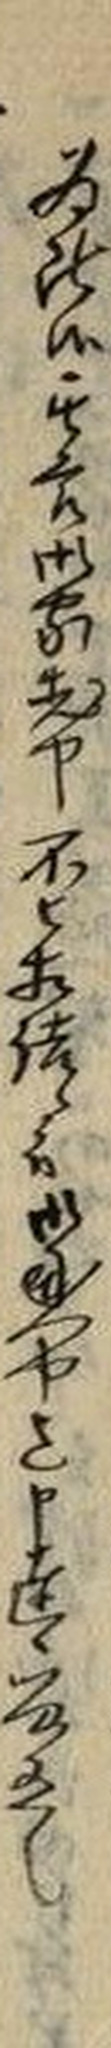為断候其節御家老中不被相詰候付御用人中迄申達候留有之
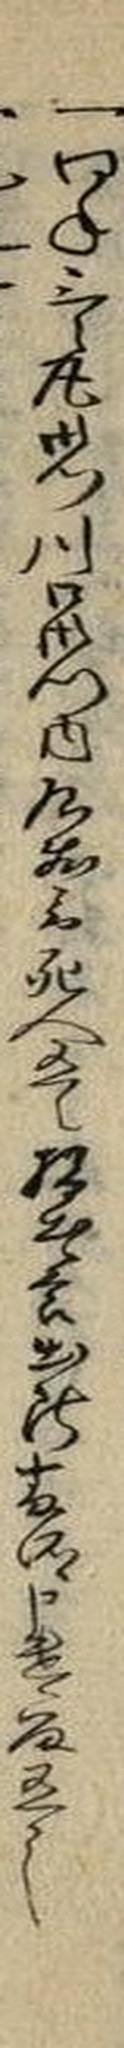一同年三之丸御門川口御門内屋敷に而死人有之指出候節出断番所へ申遣候留有之
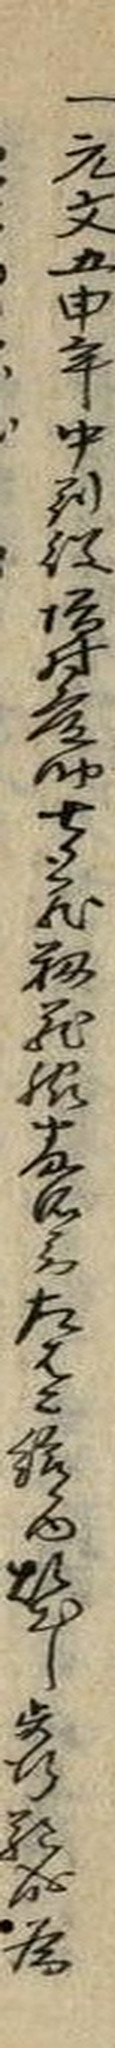一元文五申年中判役増村藤助七ツ蔵籾蔵脇番所に而たはこ給候内煩出し歩行難成為
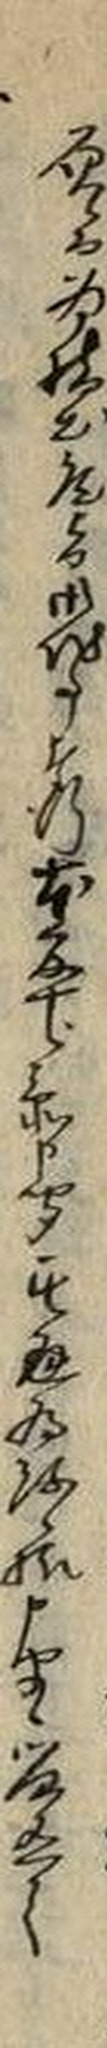負候而為指出度旨御作事奉行本多十郎兵衛申聞其通為致候様申聞候留有之
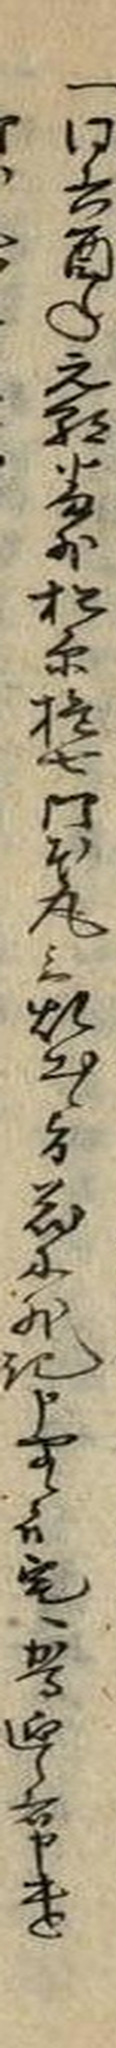一同六酉年元朝番外松原権七御本丸に而煩出候旨花木外記申聞候に付宅へ駕廻候者申遣
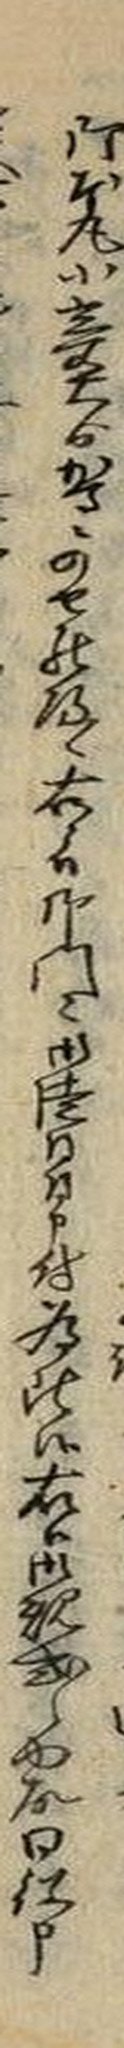御本丸小玄関ゟ駕にのせ罷帰候右に付御門々御徒目付申付為断候右は御規式之由故同役申
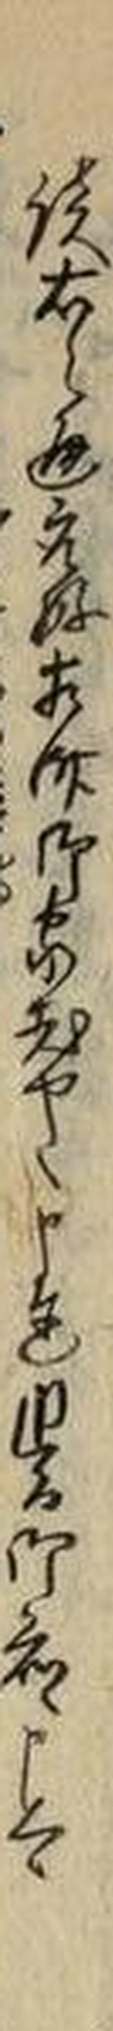談右之通取扱相済御家老中へ申達追而御前へ申上候
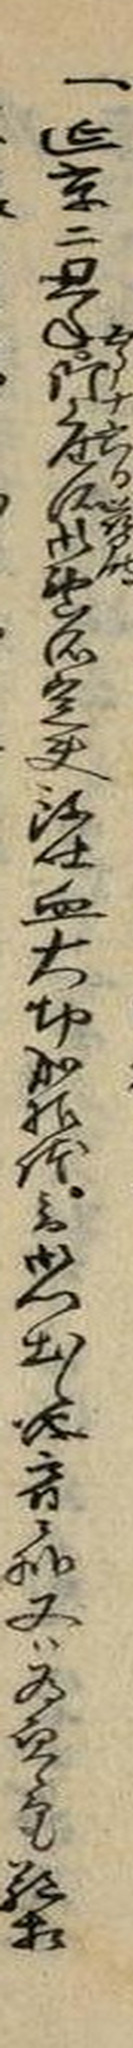一延享二丑年五月十六日暮時御座所御台所定夫致吐血大切成様体に而御門出候儀肩に掛又は為負候而も難相
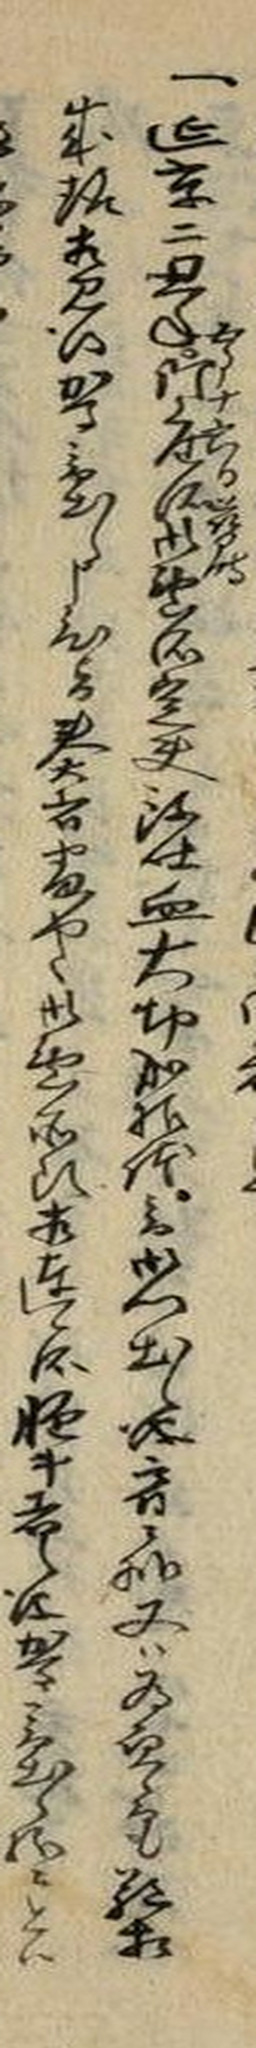成趣相見得駕に而出し申度旨奏者番中へ御台所頭相達候処軽き者之儀駕に而出候様にとは
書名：御門御櫓之部
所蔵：福井県文書館 Fukui Prefectural Archives
